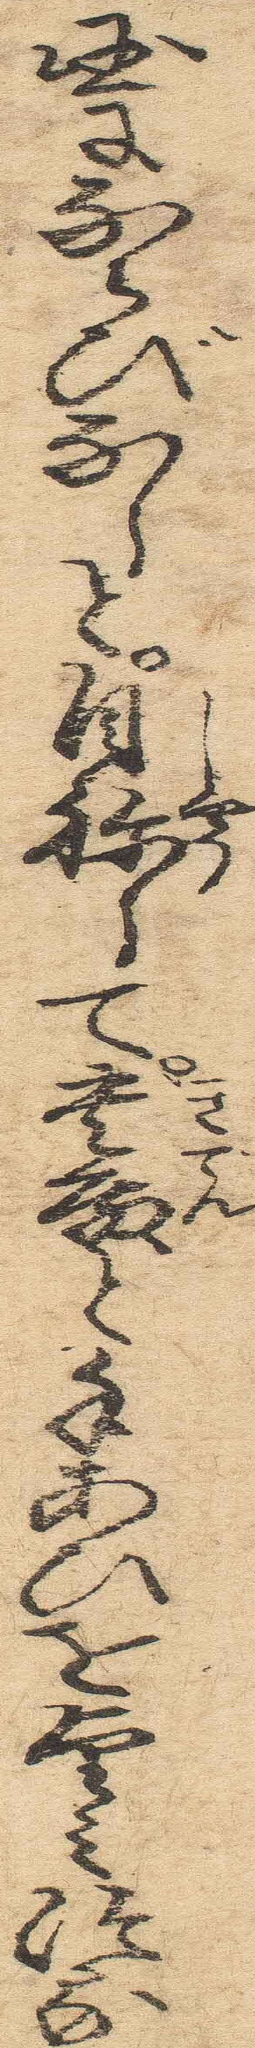国にならびなしと。自称して。貴殿と手あひを望みする
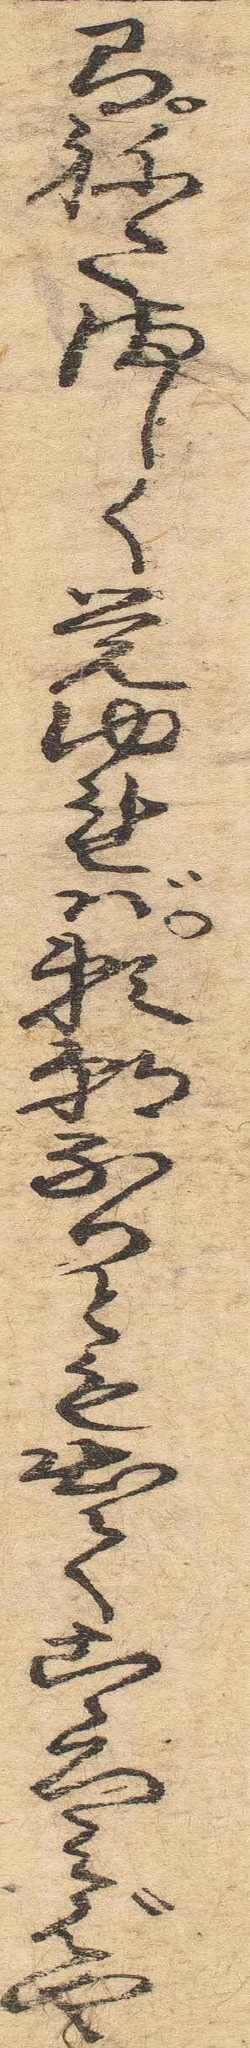間。ねたましく覚ゆれば。頼朝なりとも出てこゝろみんや
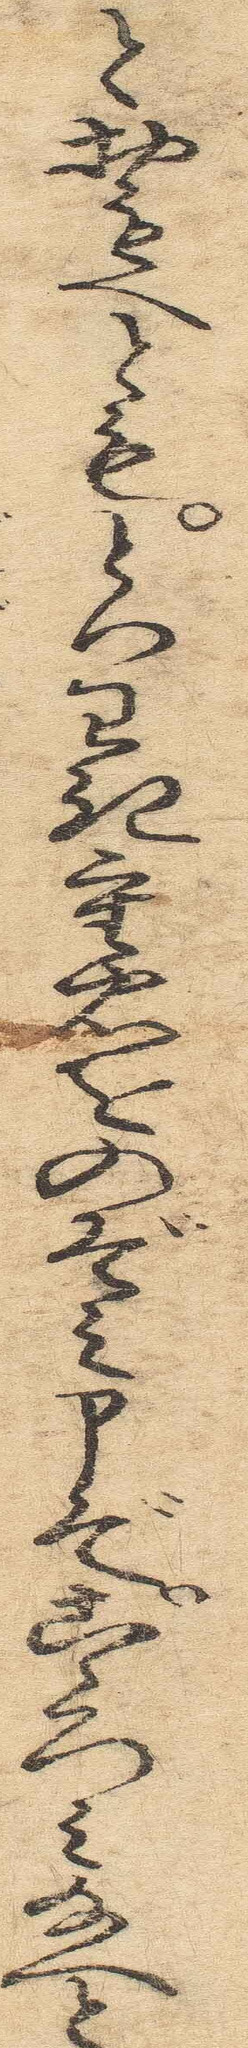とおもへとも。とりわき重忠をのぞみ申ぞこゝろみ給へと
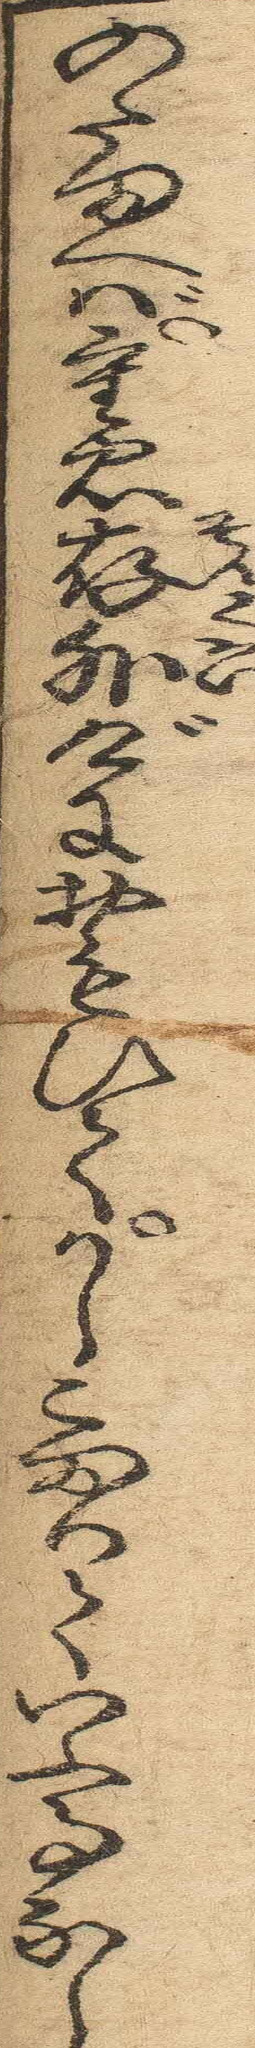のたまへば。重忠存外げにおもひて。かしこまりていふ事なし
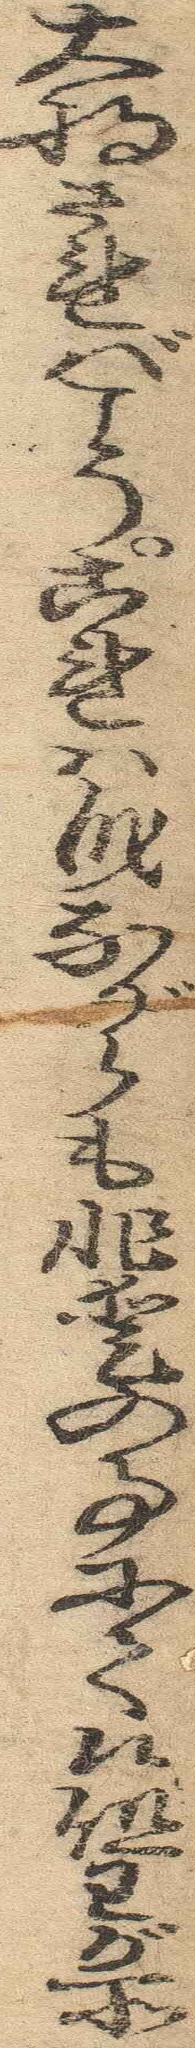大将さればこそ。これは我ながらも非愛の事にて候。但わが所
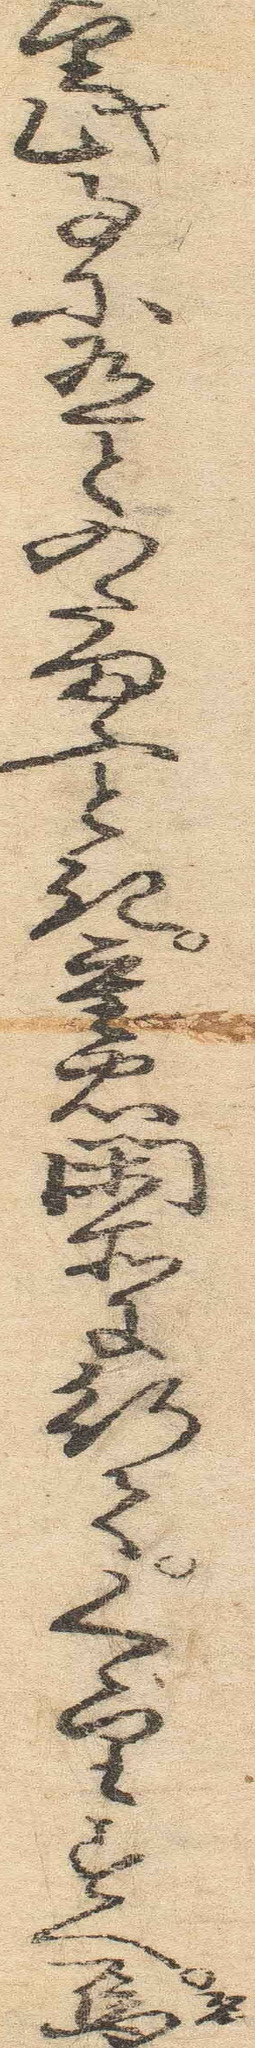望此事に有とのたまうとき、重忠閑所に行て。くゝりすへ。鳥
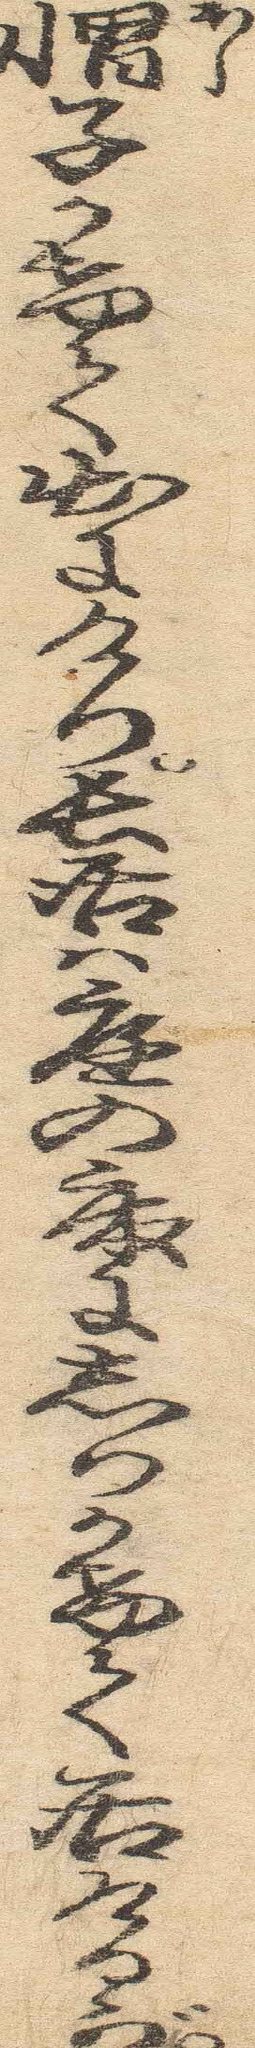帽子かけて出にけり。長居は庭の床にしりかけて居けるが。
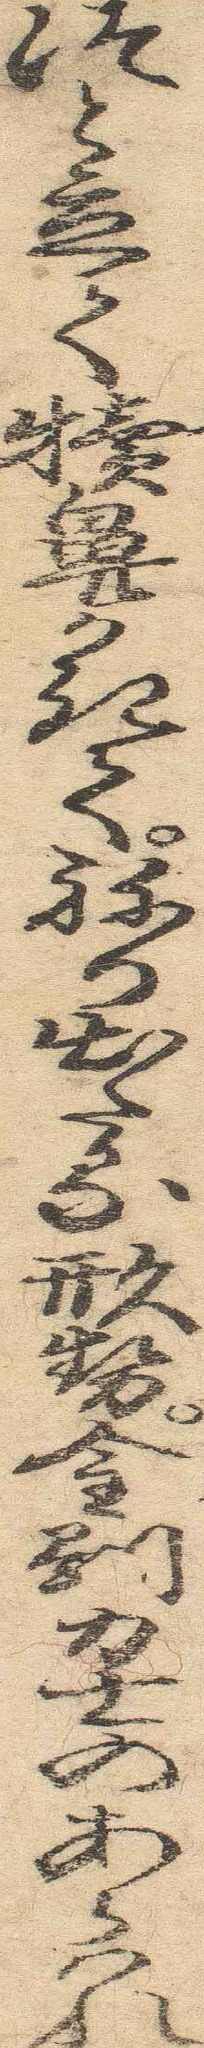つと立て犢鼻つきてねり出たる形勢。金剛力士のあらはれ
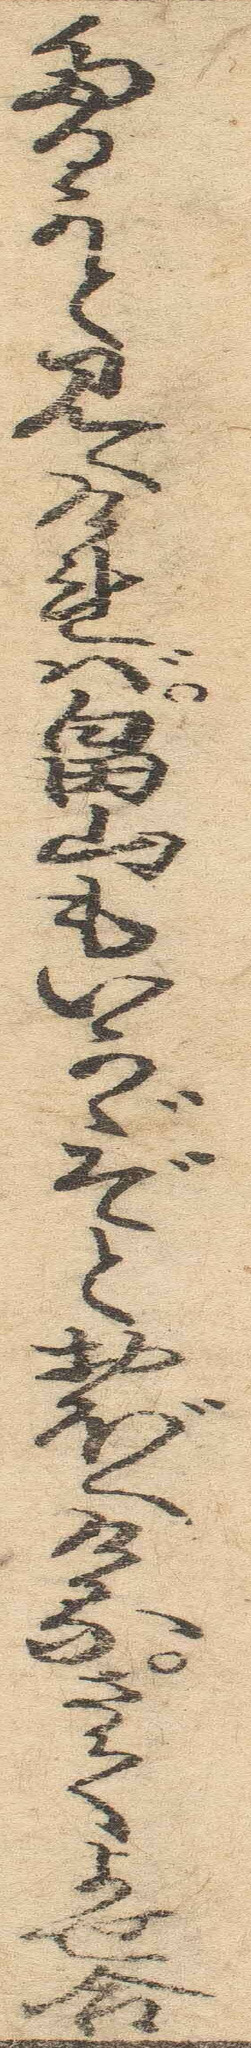たるかと見へければ。畠山もいかゞぞとおぼへける。さてよせ合
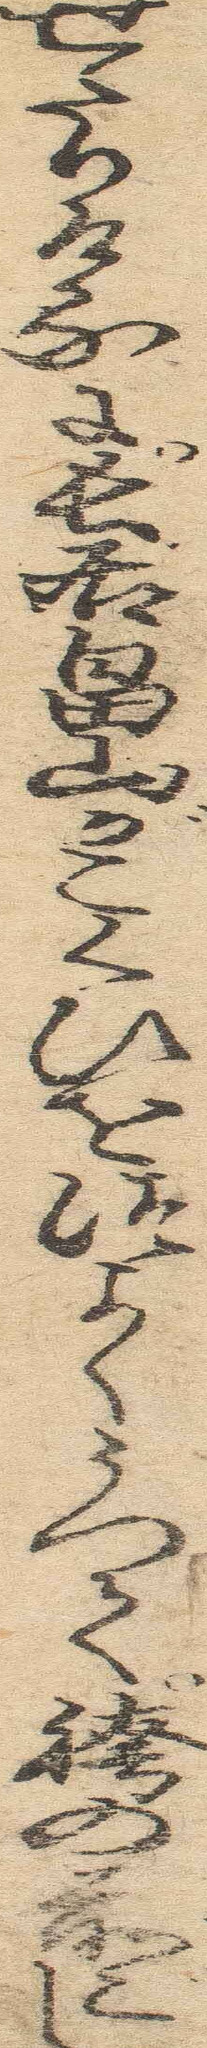せたるけるに。長居畠山がこくひをつよくうつて袴の前ごし
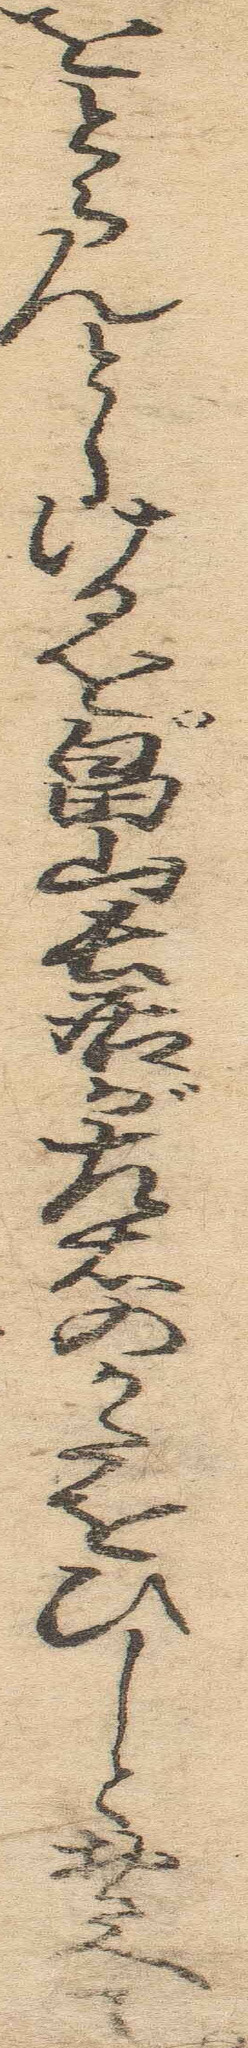をとらんとしけるを｡畠山長居が左右の肩をひしとおさへて。
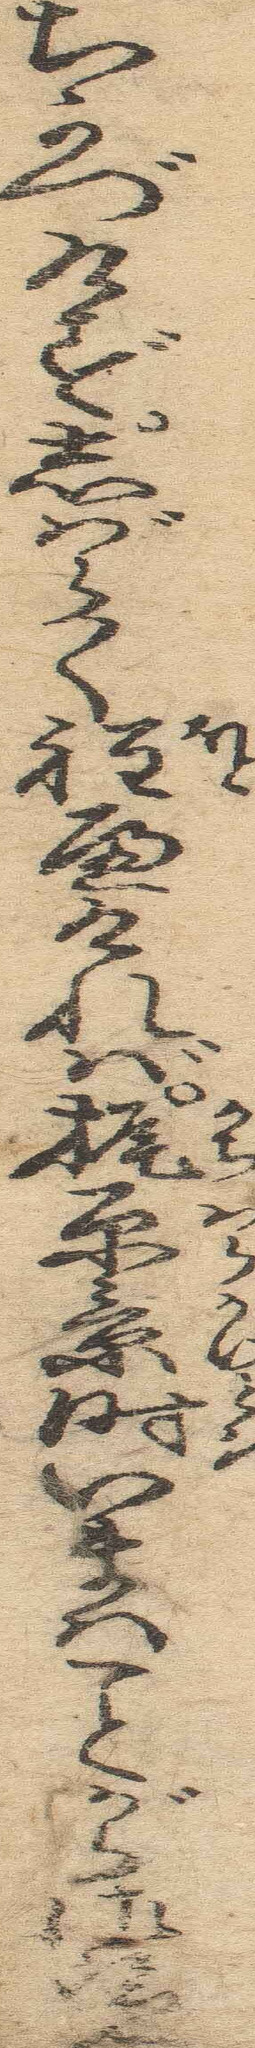ちかづけず。しばらく程へければ梶原景時いまはことがら御覧
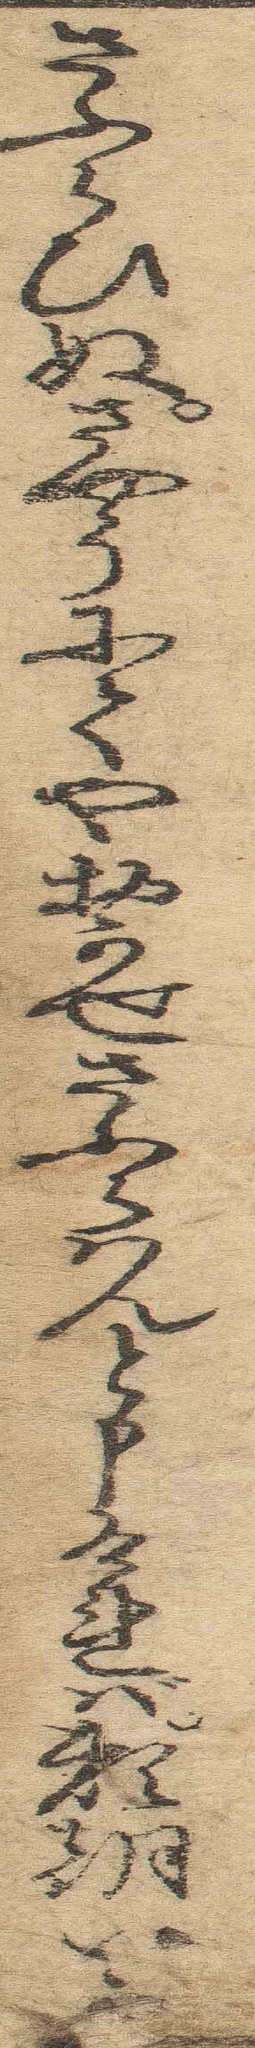さふらひぬ。さやうにてやおかせさうらはんと申ければ頼朝いか

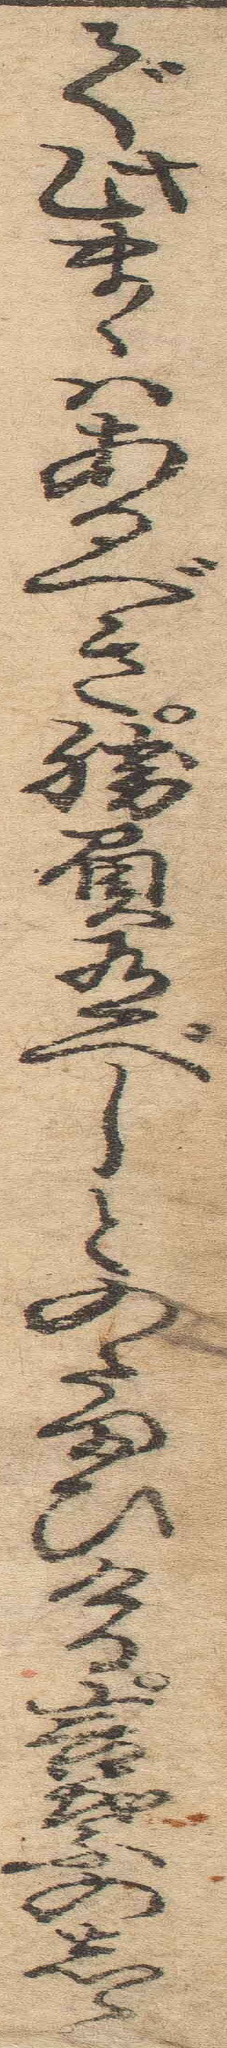で此まゝはあるべき。勝負有べしとのたまひける。言葉のしゝ
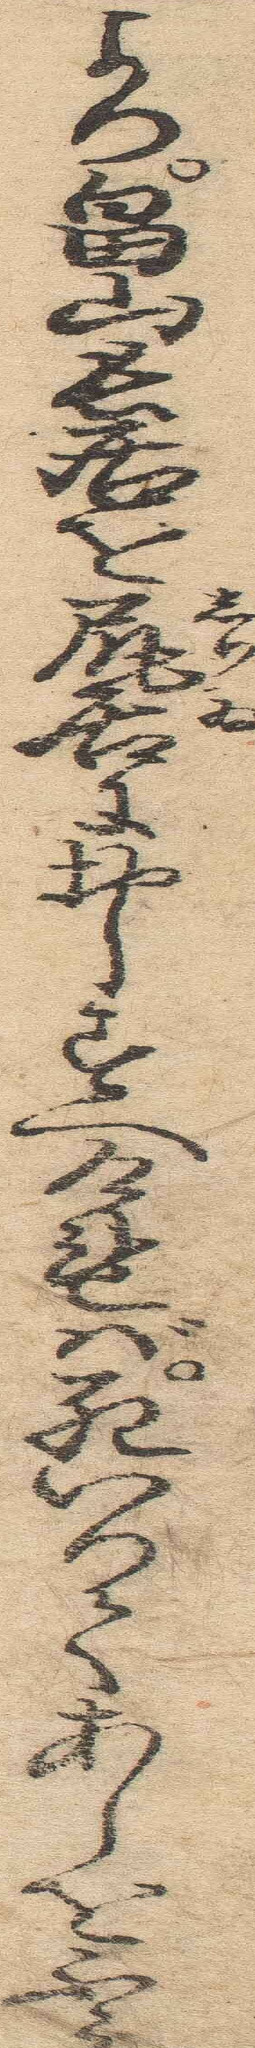より畠山長居を尻居におしすへければ。罷りいりてあしをふみ
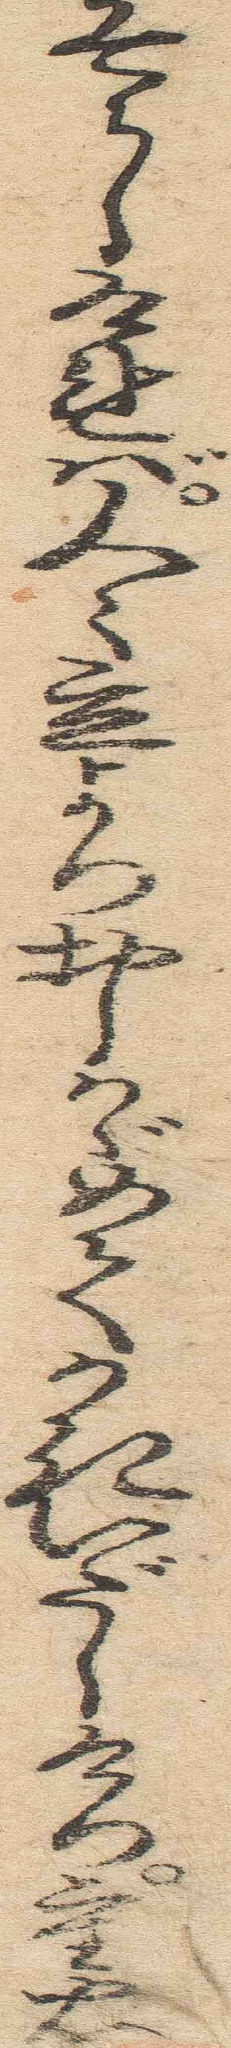そらしければ。人々立よりおしかゞめてかきだしける。重忠
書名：古今相撲大全
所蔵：東京学芸大学附属図書館 国文学研究資料館
